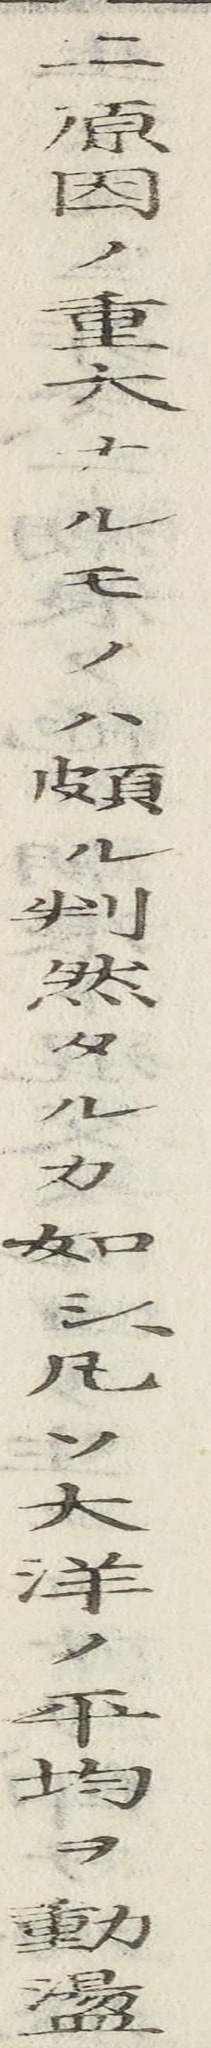ニ原因ノ重大ナルモノハ頗ル判然タルカ如シ、凡ソ大洋ノ平均ヲ動盪
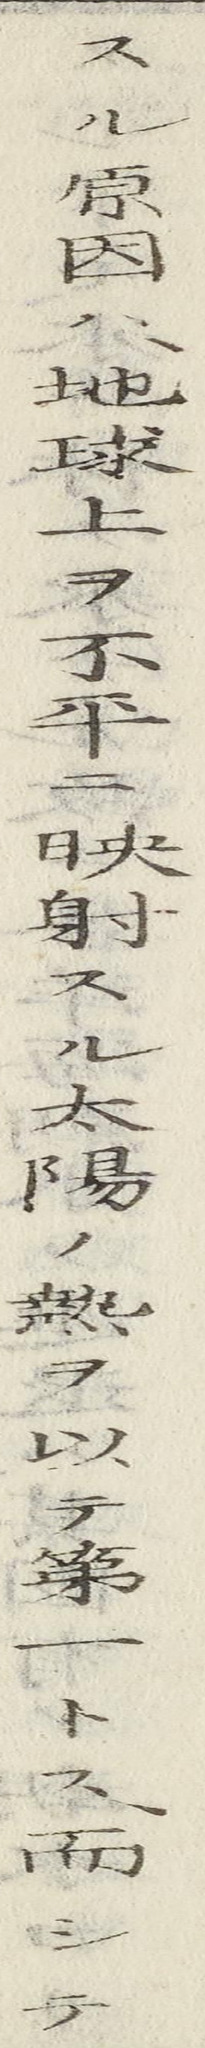スル原因ハ、地球上ヲ不平ニ映射スル太陽ノ熱ヲ以テ第一トス、而シテ
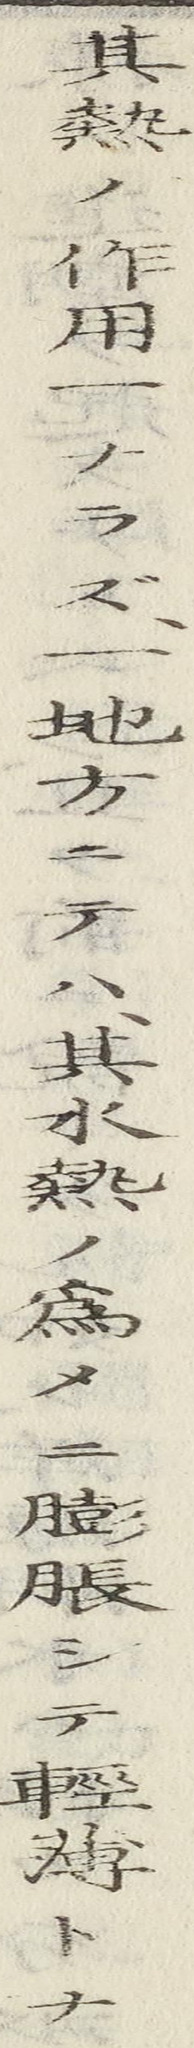其熱ノ作用一ナラズ、一地方ニテハ、其水熱ノ為メニ膨脹シテ軽薄トナ
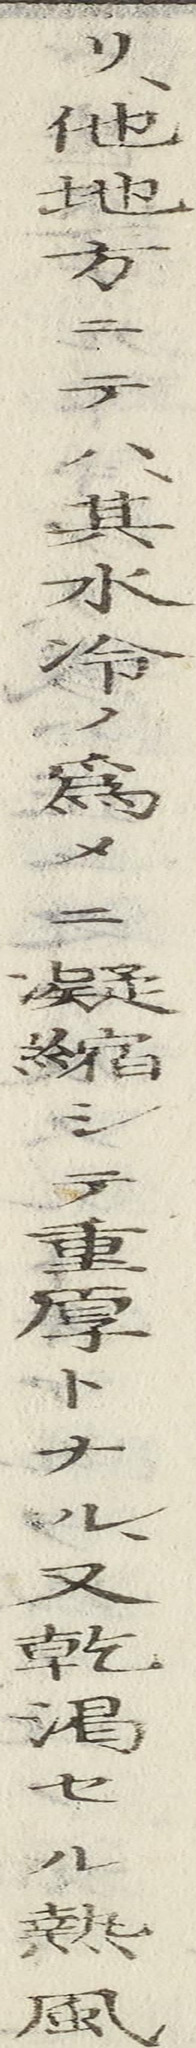リ、他地方ニテハ、其水冷ノ為メニ凝縮シテ重厚トナル、又乾渇セル熱風
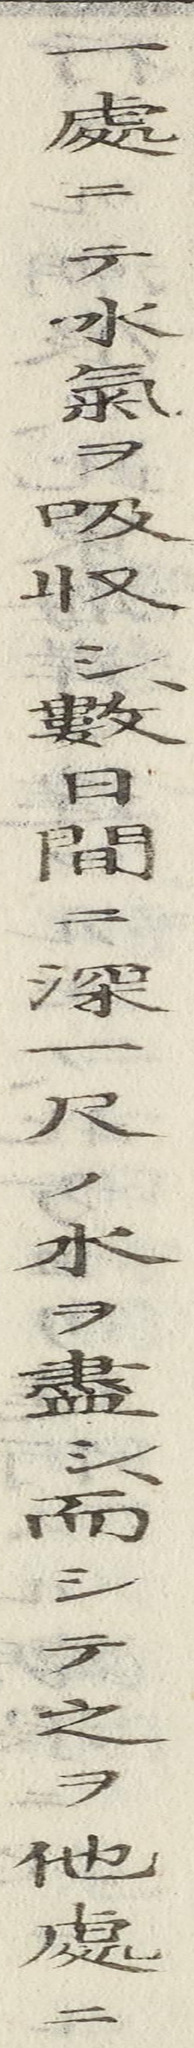一処ニテ水気ヲ吸収シ、数日間ニ深一尺ノ水ヲ尽シ、而シテ之ヲ他処ニ
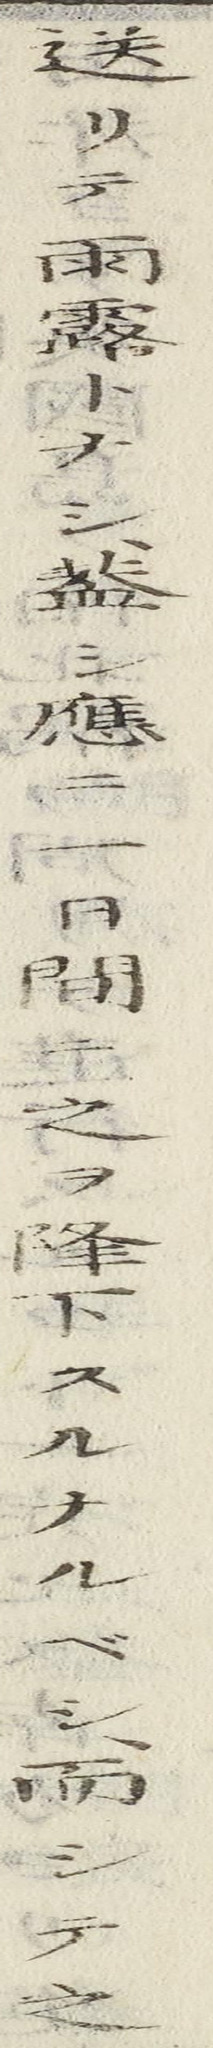送リテ雨露トナシ、蓋シ応ニ一日間ニ之ヲ降下スルナルベシ、而シテ之
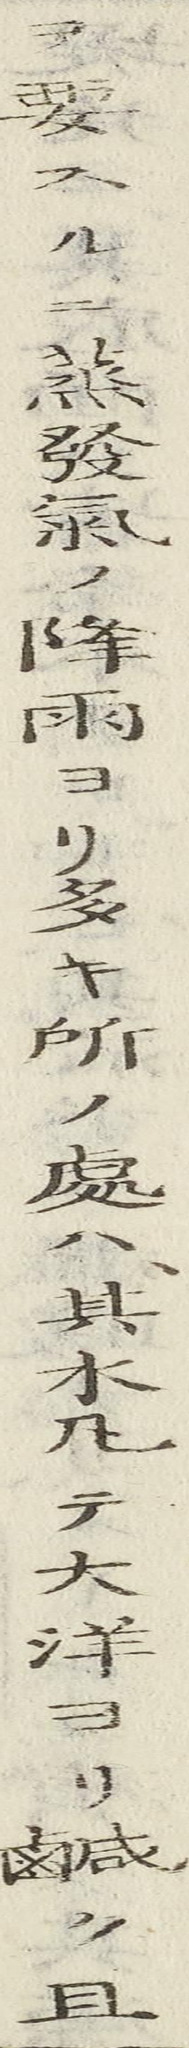ヲ要スルニ蒸発気ノ降雨ヨリ多キ所ノ処ハ、其水凡テ大洋ヨリ鹹ク且
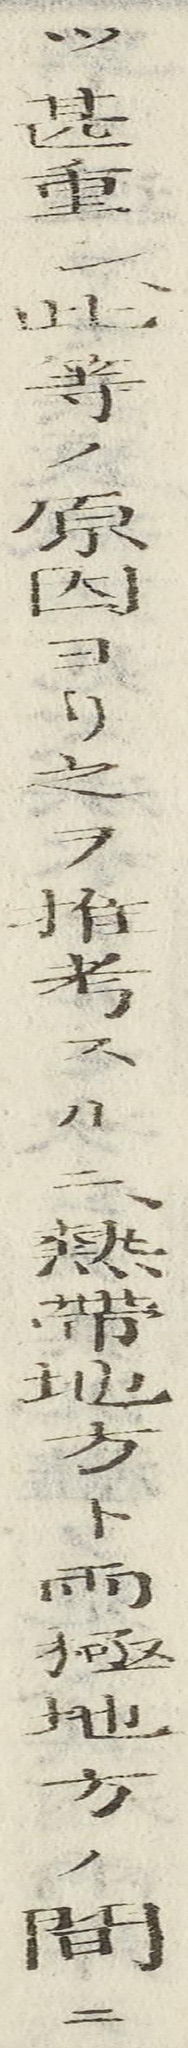ツ甚重シ、此等ノ原因ヨリ之ヲ推考スルニ、熱帯地方ト両極地方ノ間ニ
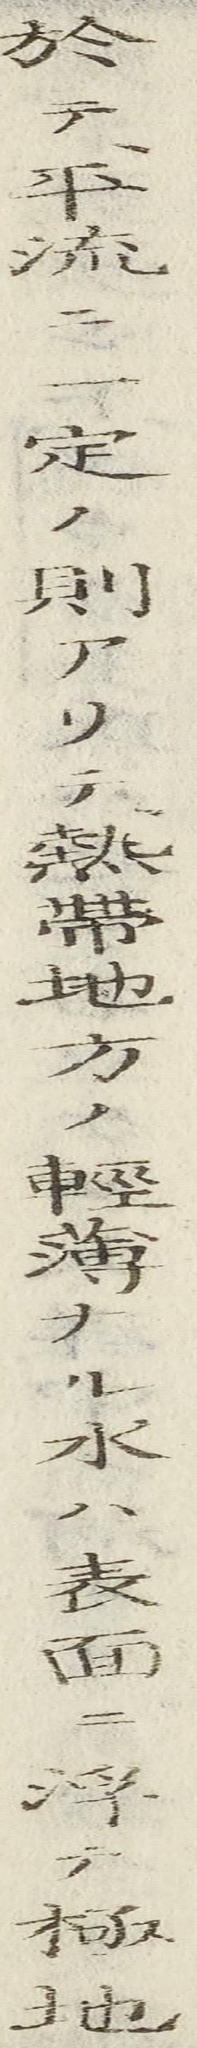於テ、平流ニ一定ノ則アリテ、熱帯地方ノ軽薄ナル水ハ表面ニ浮テ極地
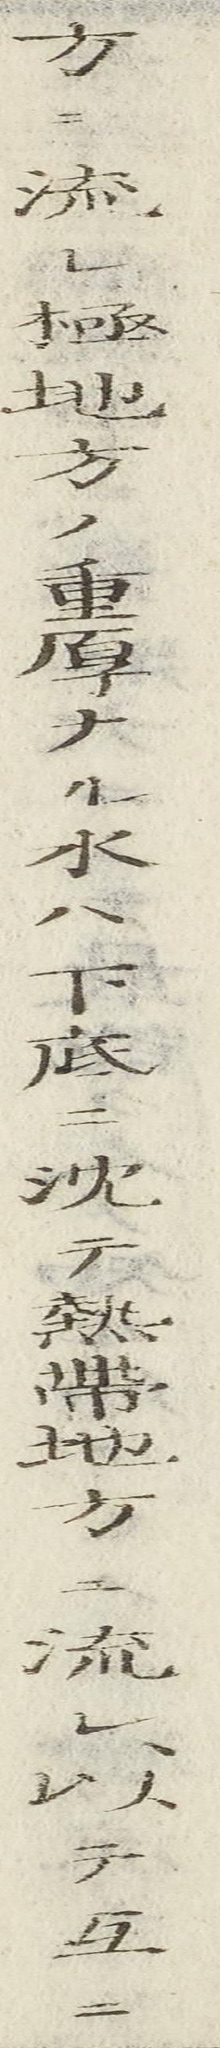方ニ流レ極地方ノ重厚ナル水ハ下底ニ沈テ熱帯地方ニ流レ、以テ互ニ
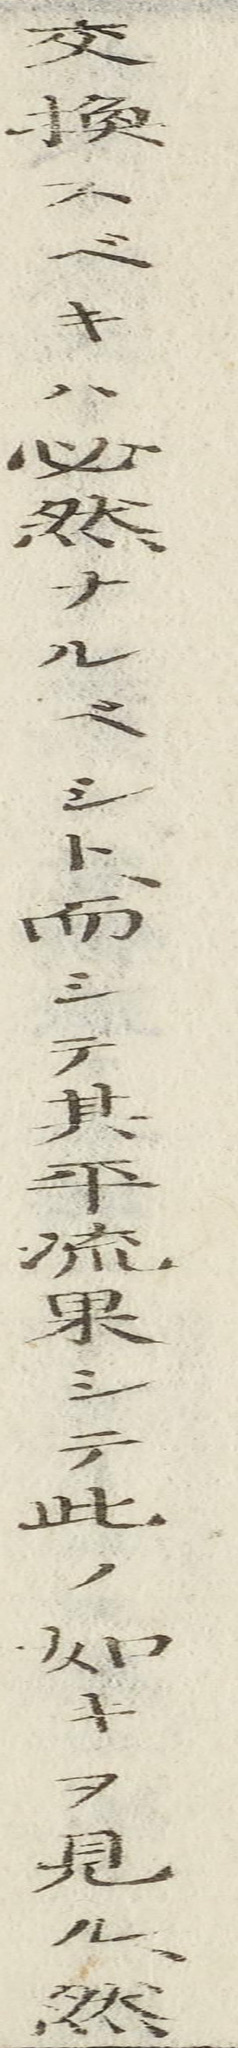交換スベキハ必然ナルベシト、而シテ其平流果シテ此ノ如キヲ見ル、然
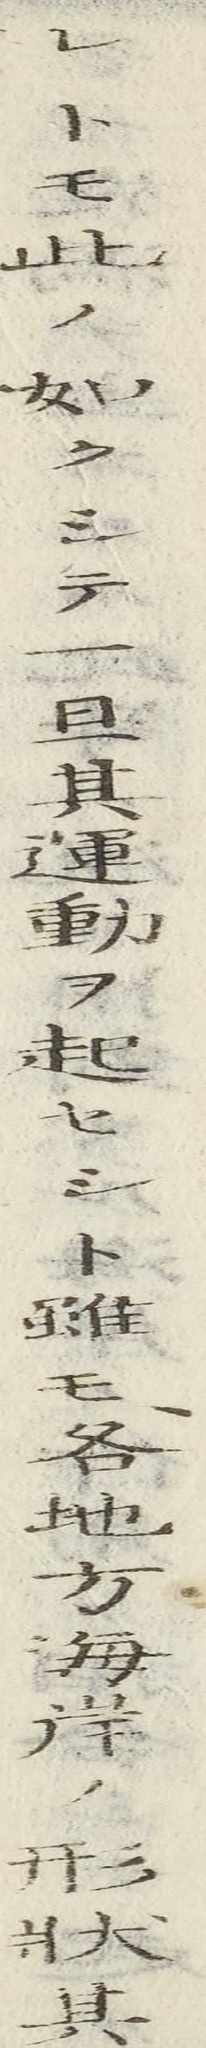レトモ此ノ如クシテ一旦其運動ヲ起セシト雖モ、各地方海岸ノ形状其
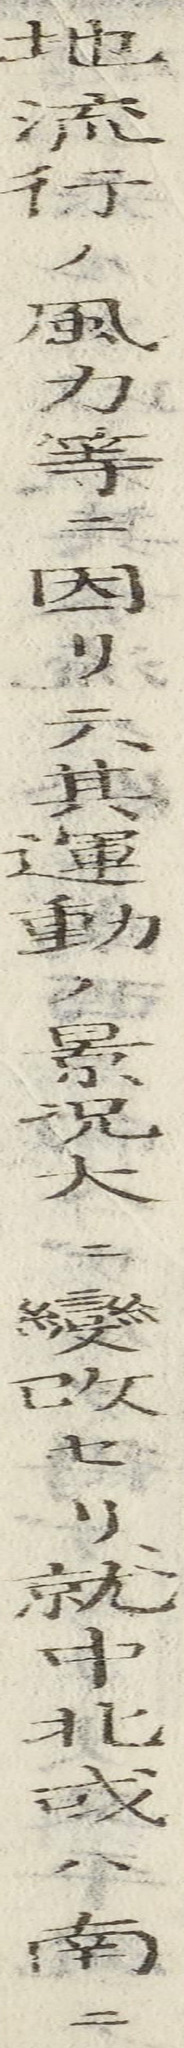地流行ノ風力等ニ因リテ、其運動ノ景況大ニ変改セリ、就中北或ハ南ニ
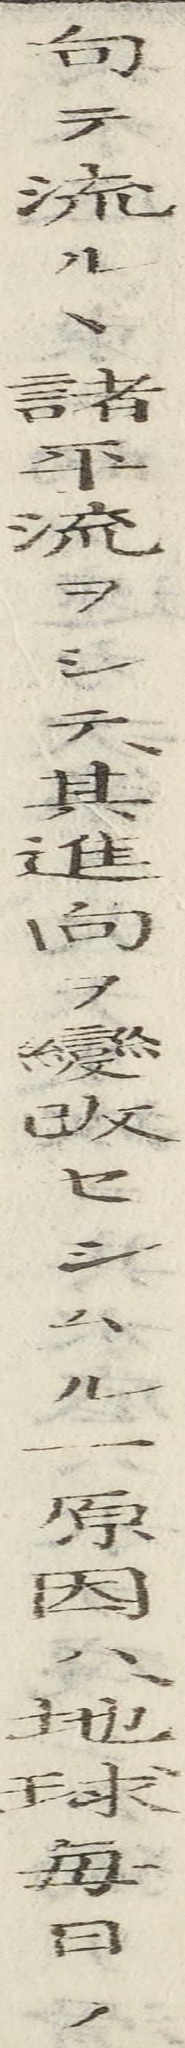向テ流ルヽ緒平流ヲシテ、其進向ノ変改セシムル一原因ハ、地球毎日ノ
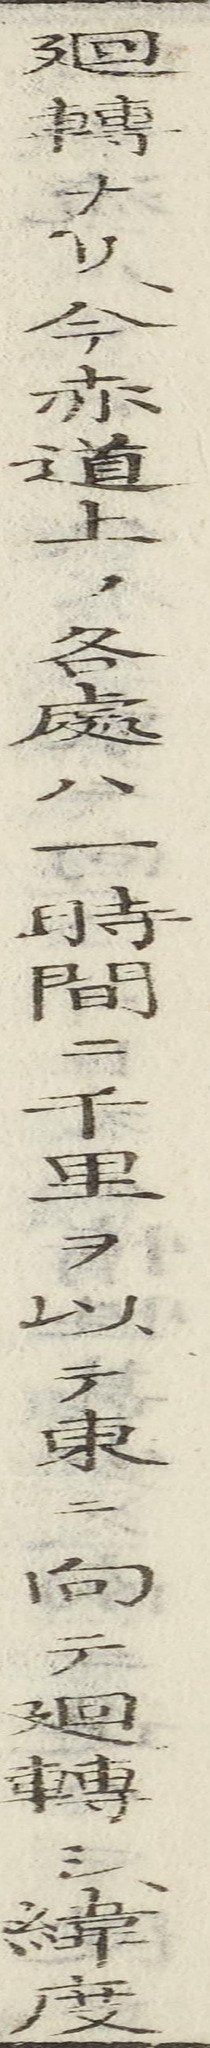廻転ナリ、今赤道上ノ各処ハ一時間ニ千里ヲ以テ東ニ向テ廻転シ、緯度
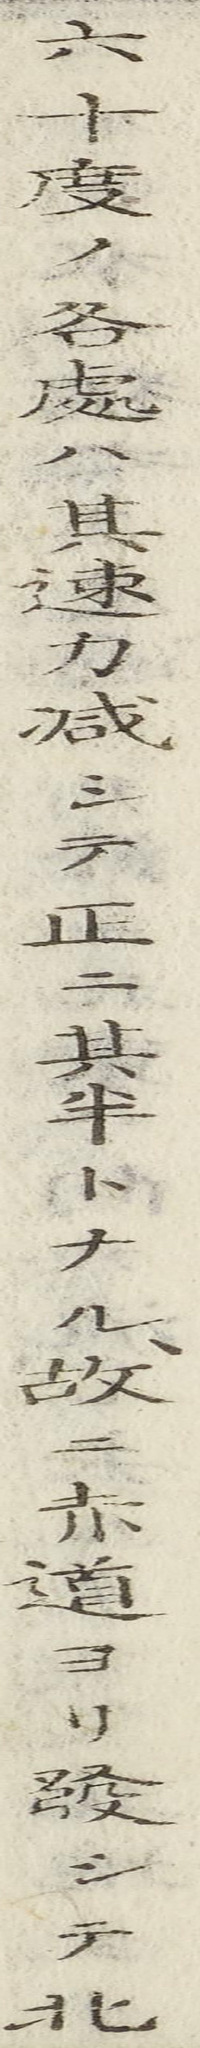六十度ノ各処ハ其速力減シテ正ニ其半トナル、故ニ赤道ヨリ発シテ北
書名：百科全書　地文學　全
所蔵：東京大学地震研究所図書室 Earthquake Research Institute Library, The University of Tokyo, JAPAN
